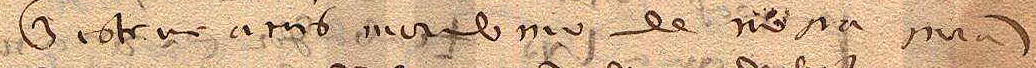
item esteue an̄es mordomo de nossa snorā
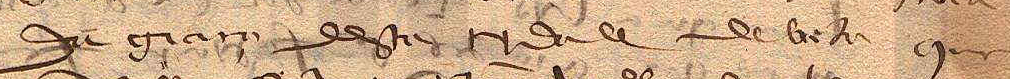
da graça desta cydade de beJa que
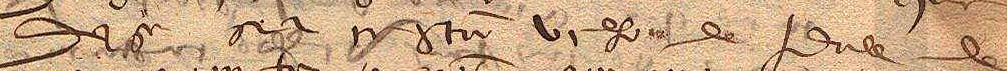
dyse ser cristaõ velho de Jdade de
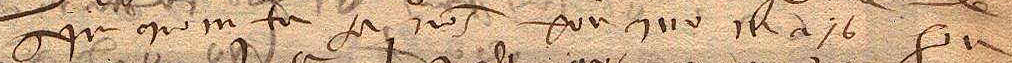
synquoenta anōs pouquo majs hou
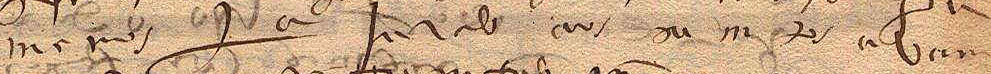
menos ta Jurado aos samtos avam
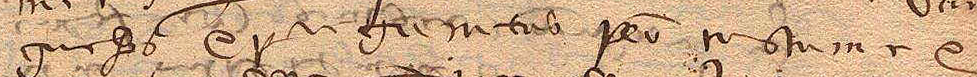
guelhos e pregumtado plō custume e
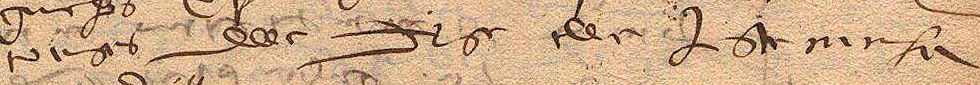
cousas dele dyse elle testemuha
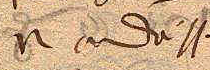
nada .//.
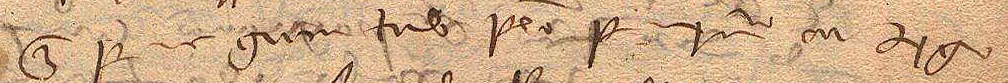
item pregumtado plō prymro artygo
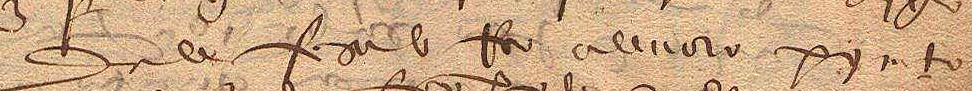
da defesa do Reo alluoro pymto
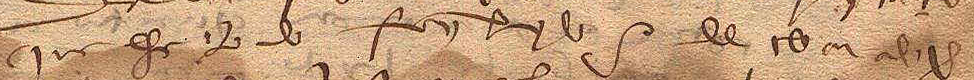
que lhe todo foy lydo e decllarado .
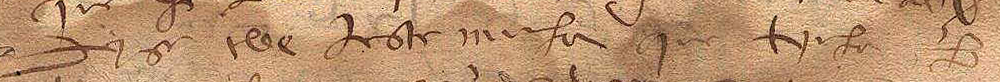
dyse elle testemuha que tynha ho
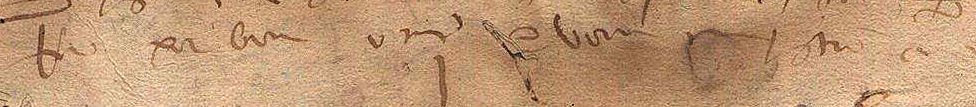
Reo por bom omē e bom crystaõ a
